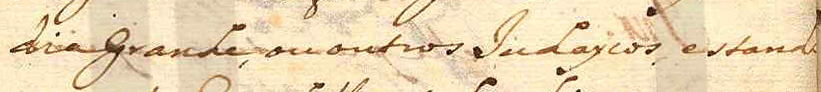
dia Grande, ou outros Iudaycos, estando
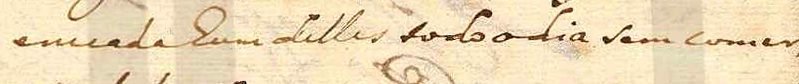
em cada hum delles todo o dia sem comer,
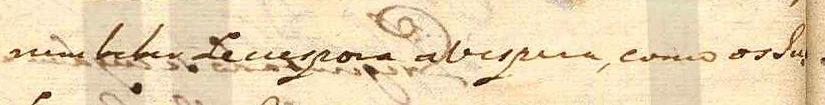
nem beber de uespora a vespera, como os Iu
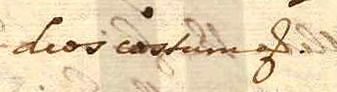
deos costumaõ.
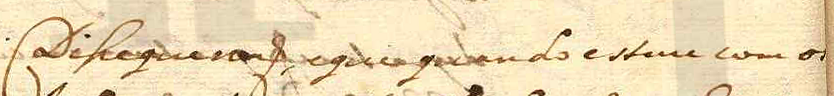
Disse que naõ, e que quando esteue com os
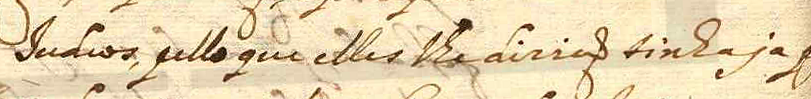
Iudeos, pello que elles lhe diziaõ tinha ja
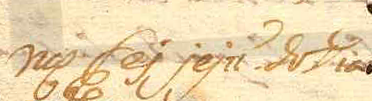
naõ fes jejū do Dia
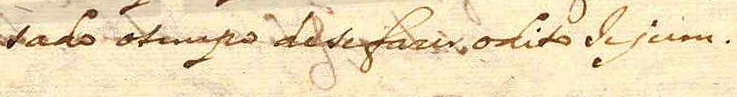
sado o tempo de se fazer o dito Iejum.
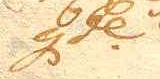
gd.e
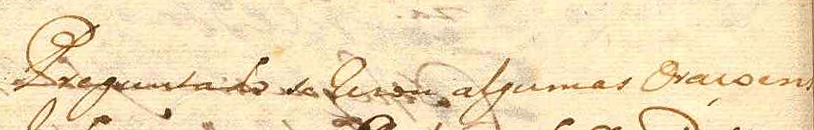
Preguntado se Rezou algumas Oraçoens
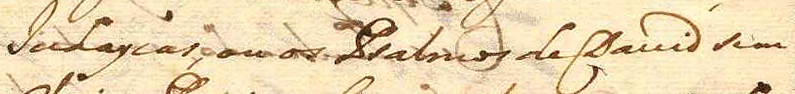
Iudaycas, ou os Psalmos de Dauid sem
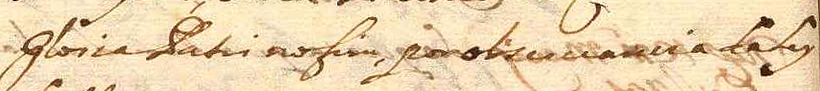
Gloria Patri no fim, por obseruancia da Ley
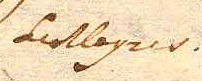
de Moyzes.
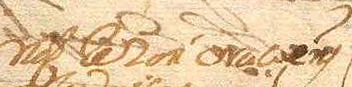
naõ Rezou oraçoẽns
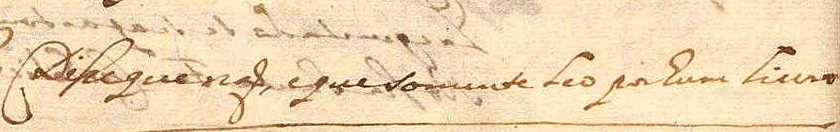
Disse que naõ, e que somente leo por hum liuro
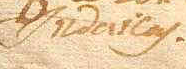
Judaicas.
